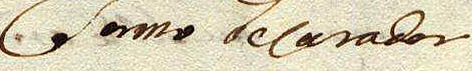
Termo de Curador
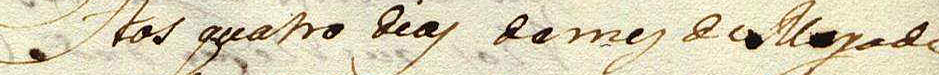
Aos quatro dias do mes de Mayo de
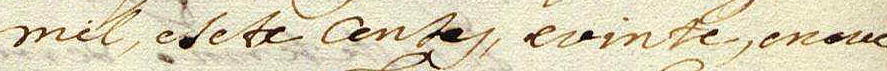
mil, e setecentos, e vinte, e nove
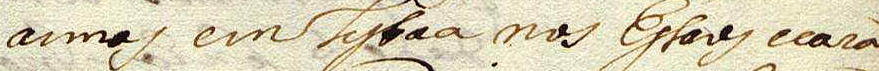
annos em Lisboa nos Estaos e caza
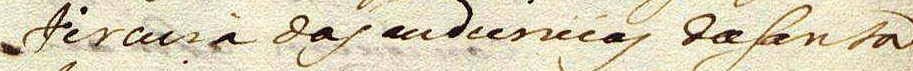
terceira das audiencias da santa
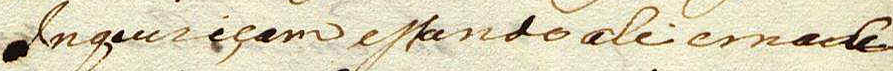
Inquiziçam estando ahi em a de
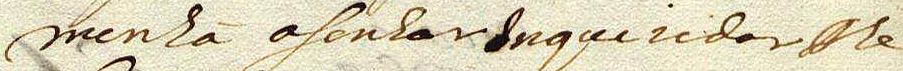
menhã o senhor Inquizidor Phe
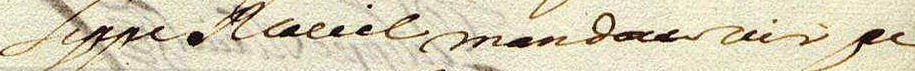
lippe Maciel mandou vir pe
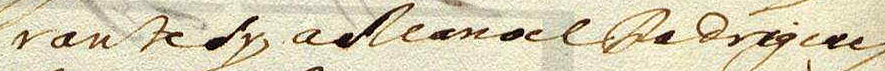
rante sy a Manoel Rodrigues
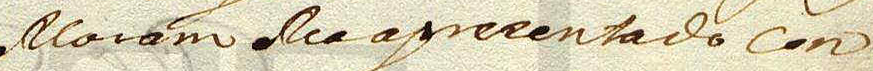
Moram Reo aprezentado con
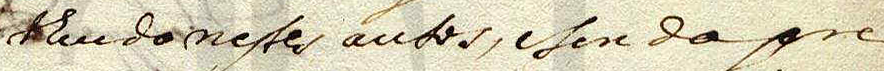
theudo nestes autos, e sendo pre
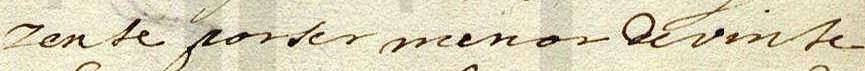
zente por ser menor de vinte
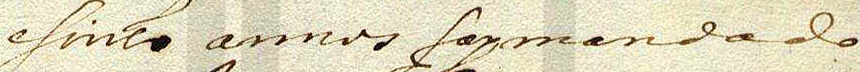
e sinco annos foy mandado
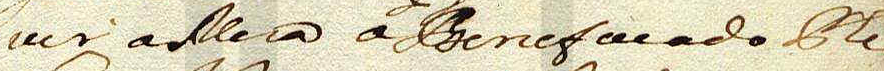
vir a Meza o Beneficiado Phe
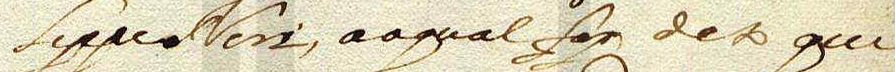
lippe Neri, ao qual foy dito que
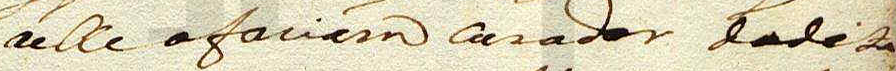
a elle o faziam curador do dito
